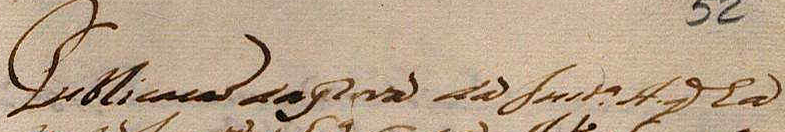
Publicaçaõ da prova da Just.a A. q̄ ha
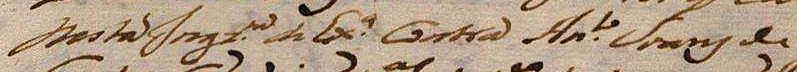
nesta Inqz.m de lx.a contra An.to Soares de
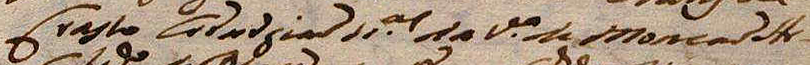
Crasto Cirurgiaõ n.al da v.a de monçaõ Ar
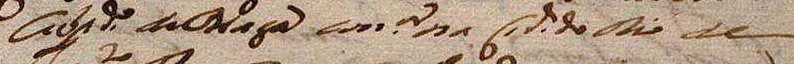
Cebpd.o de Braga e m.or na Cid.e do Rio de
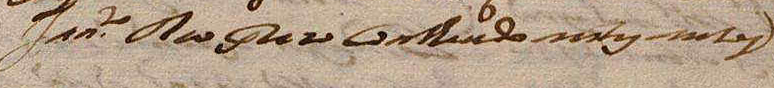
Jan.ro Reo pRezo contheudo nestes autos
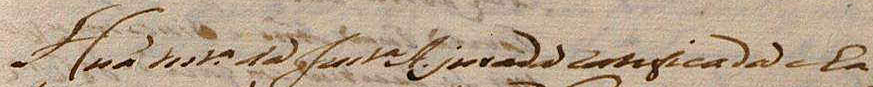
Huā test.a da Justa A. jurada rateficada e ha
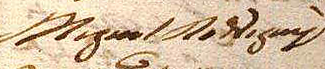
Miguel Rodrigues
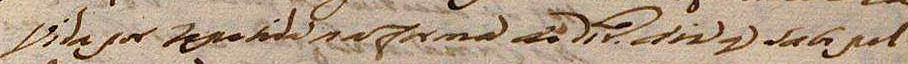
Vida por repetida na forma do dir.to diz q̄ sabe pel
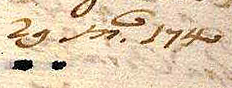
29 m.ço 1740
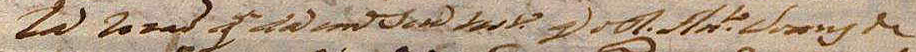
la Rezaõ q̄ da em seu test.o q̄ o R. An.to Soares de
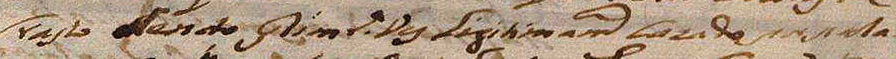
Crasto sendo primr.a ves Legitimamte cazado por pala
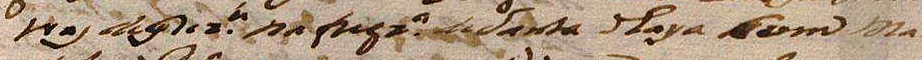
vras de prez.te na fregz.a de Santa olaya Com Ma
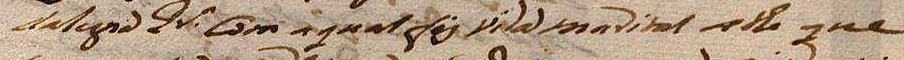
dalegna Pr.a com a qual fes vida marital athe que
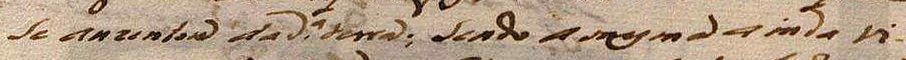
se auzentou da d.a terra; sendo a mesma ainda vi
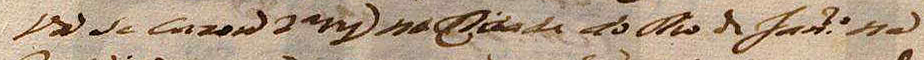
va se cazou 2a ves na Cidade do Rio de Jan.ro na
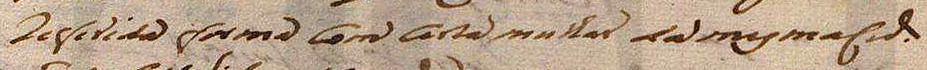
Referida forma com certa mulhar da mesma Cid.e
